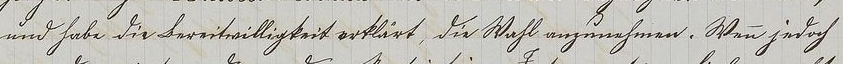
und habe die Bereitwilligkeit erklärt, die Wahl anzunehmen. Wenn jedoch
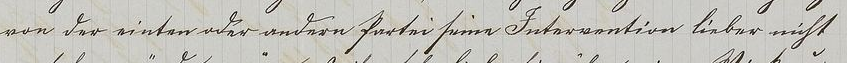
von der einten oder andern Partei seine Intervention lieber nicht
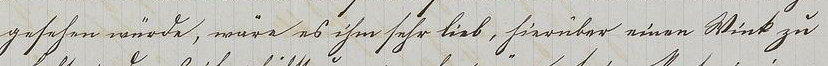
gesehen würde, wäre es ihm sehr lieb, hierüber einen Wink zu
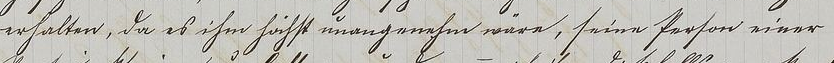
erhalten, da es ihm höchst unangenehm wäre, seine Person einer
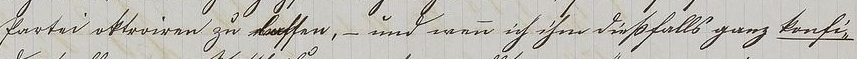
Partei oktroiren zu lassen, – und wenn ich ihm dießfalls ganz konfi-
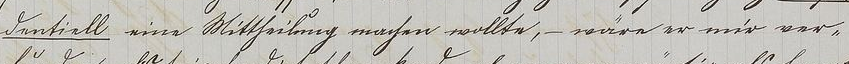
dentiell eine Mittheilung machen wollte, – wäre er mir ver-
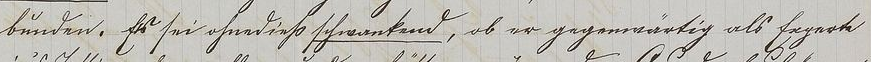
bunden. Er sei ohnedieß schwankend, ob er gegenwärtig als Experte
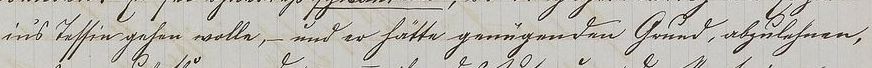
in's Tessin gehen wolle, – und er hätte genügenden Grund, abzulehnen,
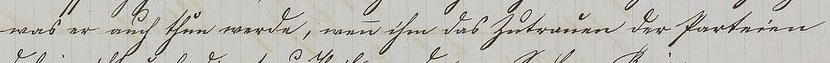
was er auch thun werde, wenn ihm das Zutrauen der Parteien
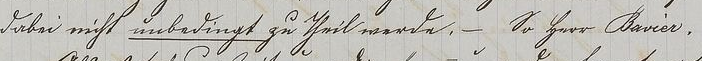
dabei nicht unbedingt zu Theil werde. – So Herr Bavier.
